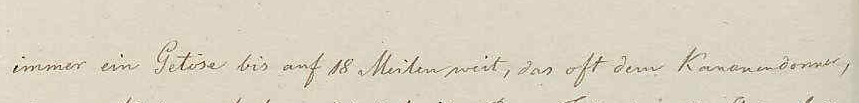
immer ein Getöse bis auf 18 Meilen weit, das oft dem Kanonendonner,
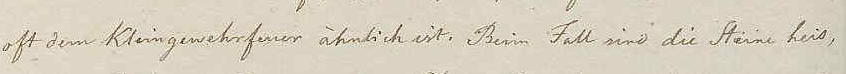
oft dem Kleingewehrfeuer ähnlich ist. Beim Fall sind die Steine heis,
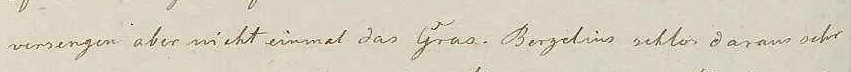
versengen aber nicht einmal das Gras. Berzelius schlos daraus sehr
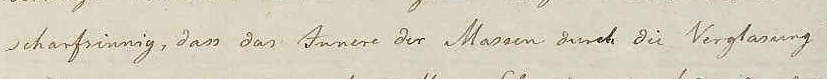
scharfsinnig, dass das Innere der Massen durch die Verglasung
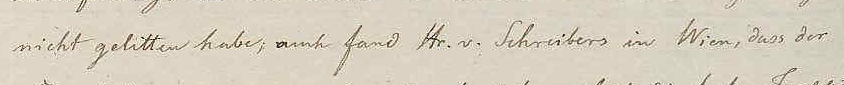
nicht gelitten habe, auch fand Hr. v. Schreibers in Wien, dass der
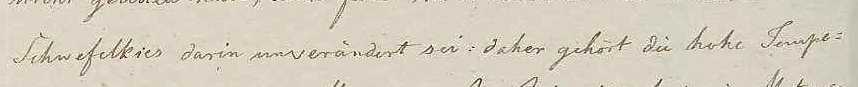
Schwefelkies darin unverändert sei: daher gehört die hohe Tempe-
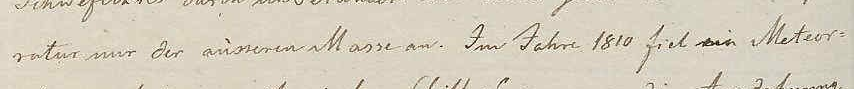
ratur nur der äusseren Masse an. Im Jahre 1810 fiel ein Meteor-
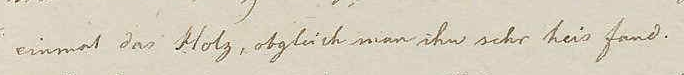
einmal das Holz, obgleich man ihn sehr heis fand.
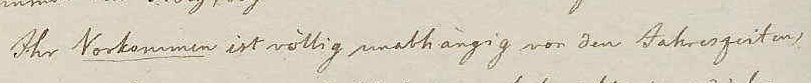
Ihr Vorkommen ist völlig unabhängig von den Jahreszeiten,
